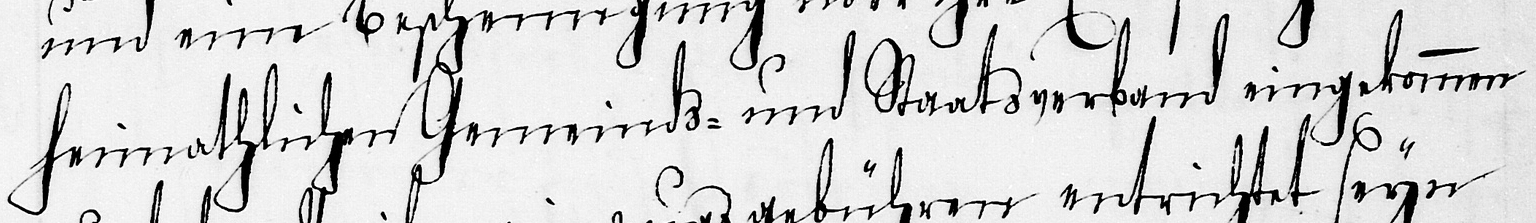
heimathlichen Gemeinds- und Staatsverband eingekommen
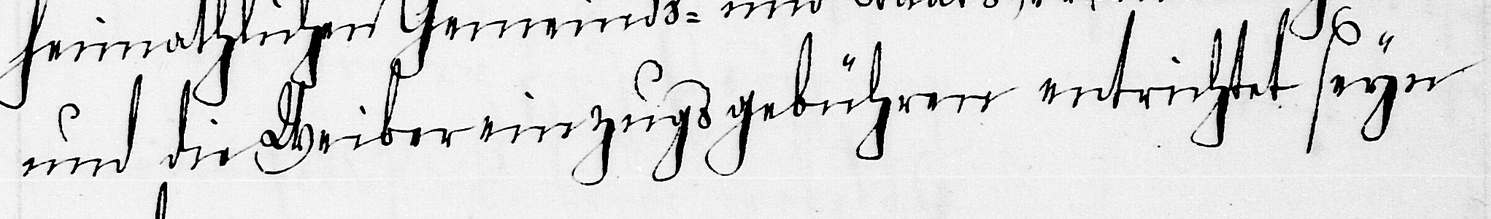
und die Weibereinzugsgebühren entrichtet seyn
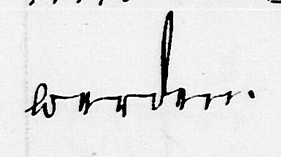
werden.
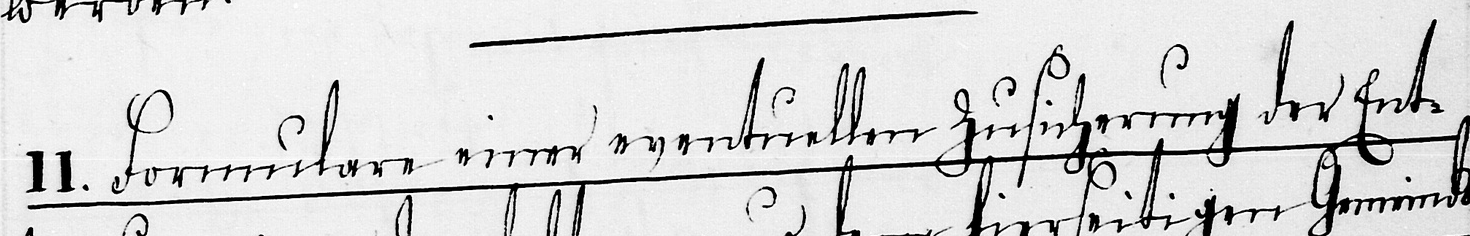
I. Formulare einer eventuellen Zusicherung der Ent¬
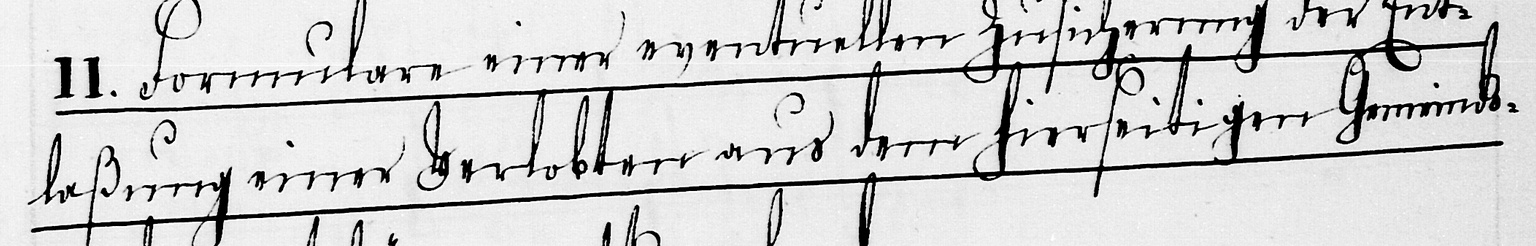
laßung einer Verlobten aus dem hierseitigen Gemeinds-
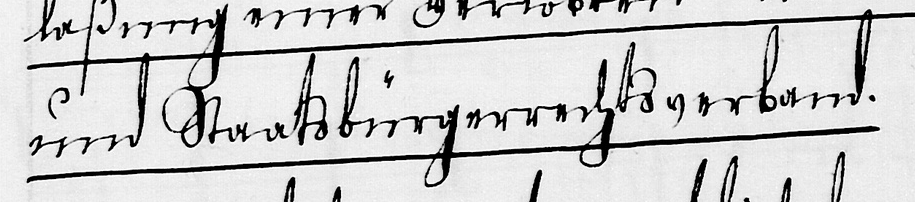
und Staatsbürgerrechtsverband.
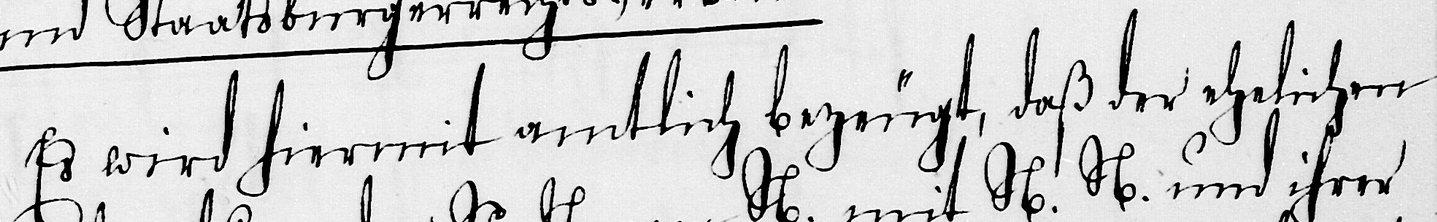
Es wird hiermit amtlich bezeugt, daß der ehelichen
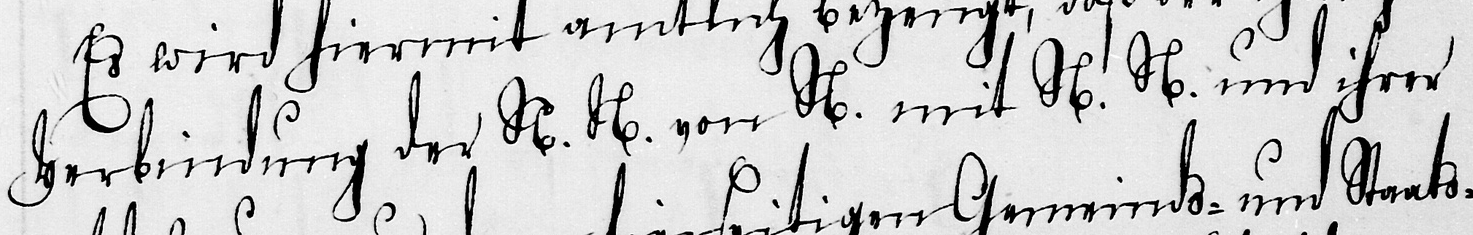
Verbindung der N. N. von N. mit N. N. und ihrer
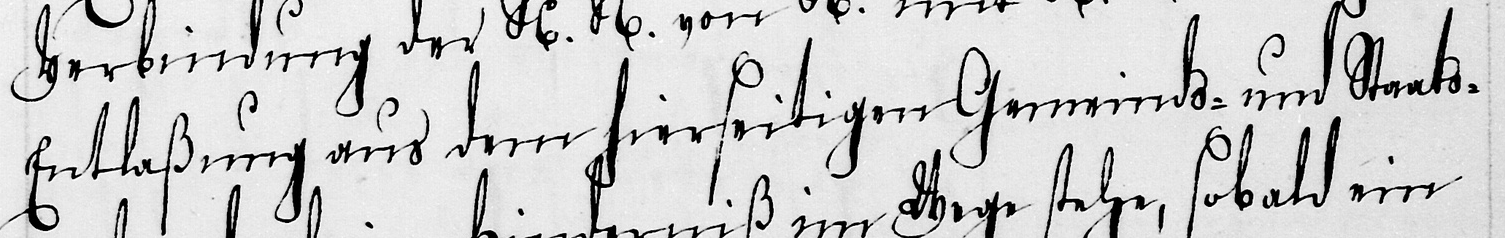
Entlaßung aus dem hierseitigen Gemeinds- und Staats¬
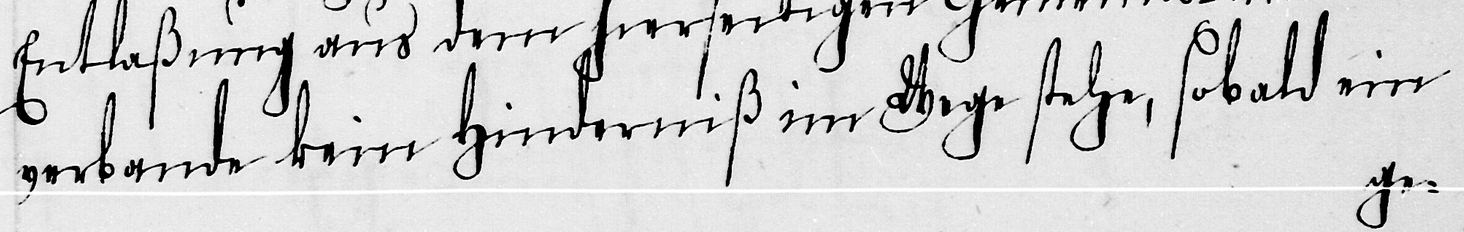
verbande kein Hinderniß im Wege stehe, sobald ein
